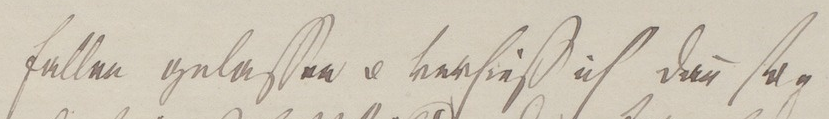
fallen gelassen & verhiess ich dann so-
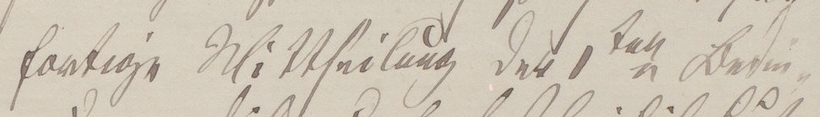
fortige Mittheilung der 1ten Bedin-
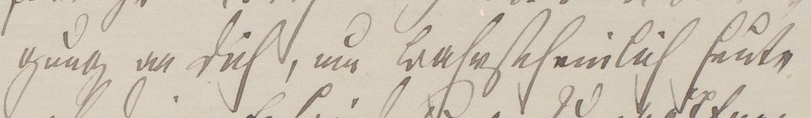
gung an Dich, um wahrscheinlich heute
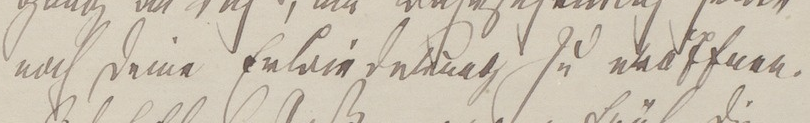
noch Deine Erwiederung zu eröffnen.
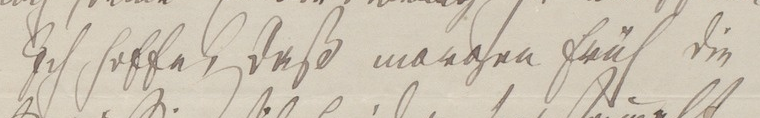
Ich hoffe, daß morgen früh die
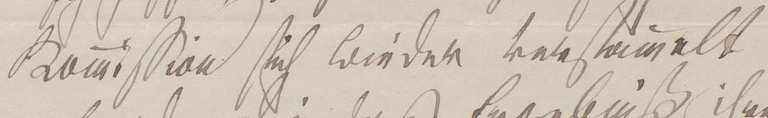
Kommission sich wieder versammelt
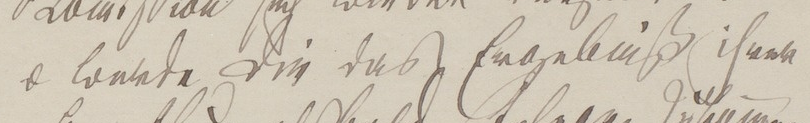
& werde Dir das Ergebniß ihrer
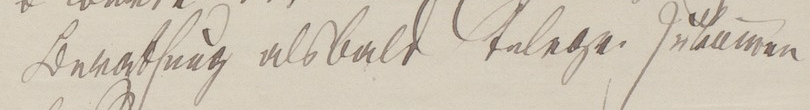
Berathung alsbald telegr. zukommen
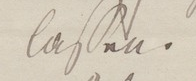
lassen.
